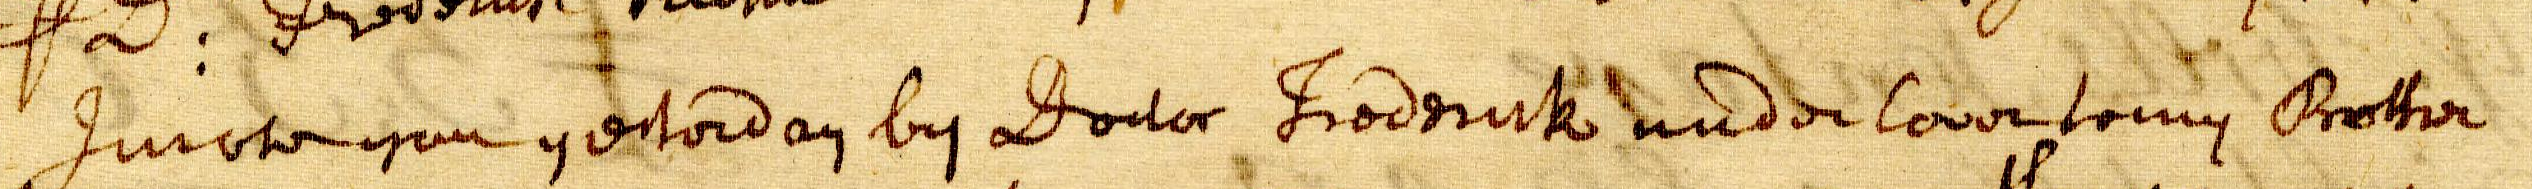I wrote you yesterday by Doctor Frederick under Cover to my Brother
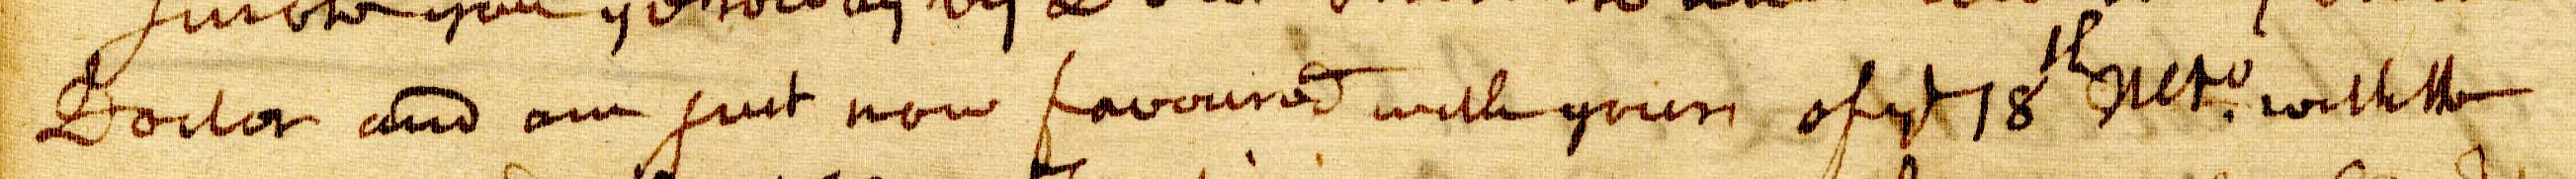Doctor and am just now favoured with yours of y^e 18^th Ult^o. with the
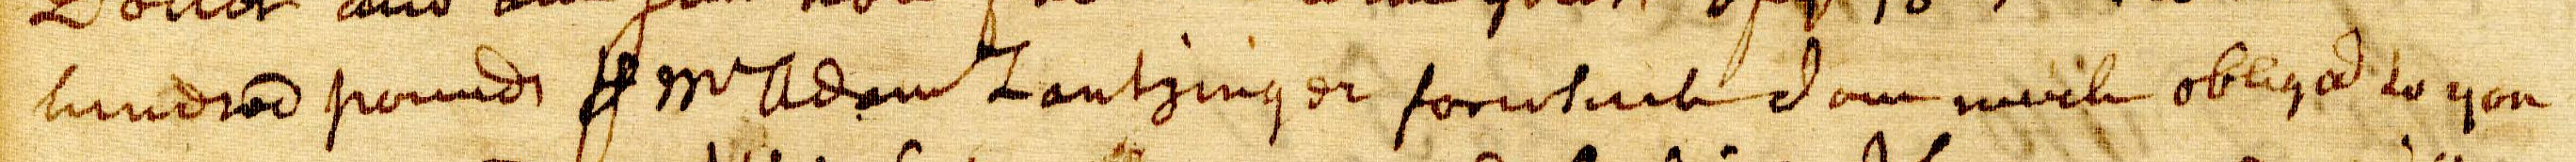hundred pounds per M^r Adam Lantzinger for which I am much obliged to you
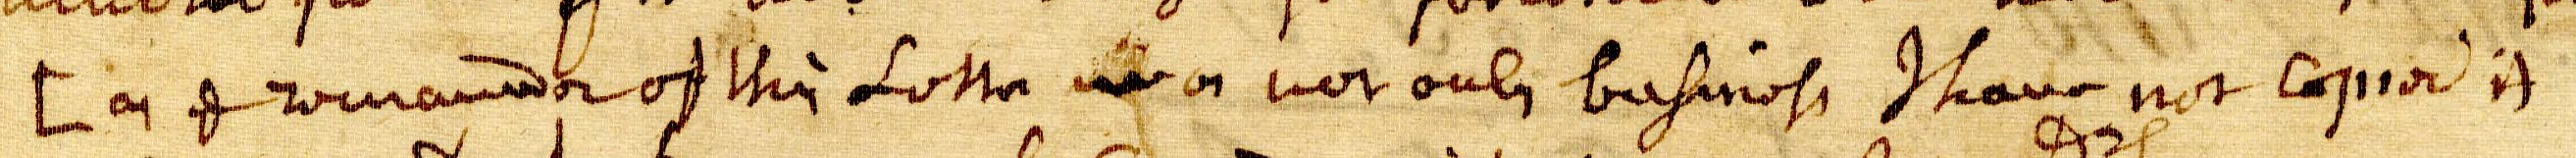(as y^e remainder of the Letter was not only business I have not Copied it
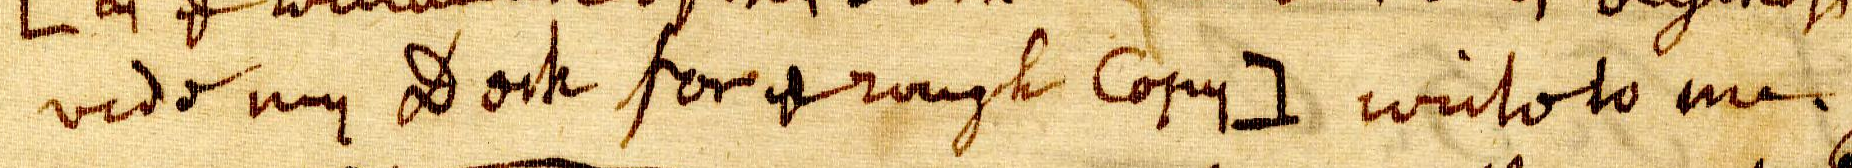vide my Desk for a rough Copy) write to me
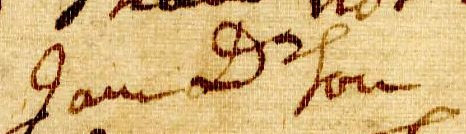You D^r Son
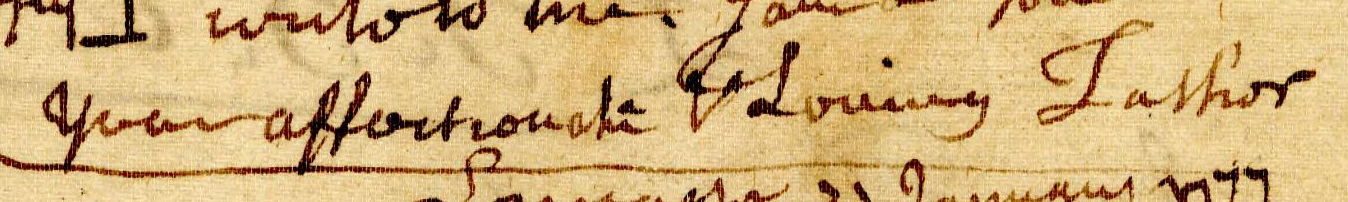Your affectionate & Loving Father
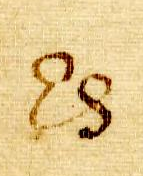ES
